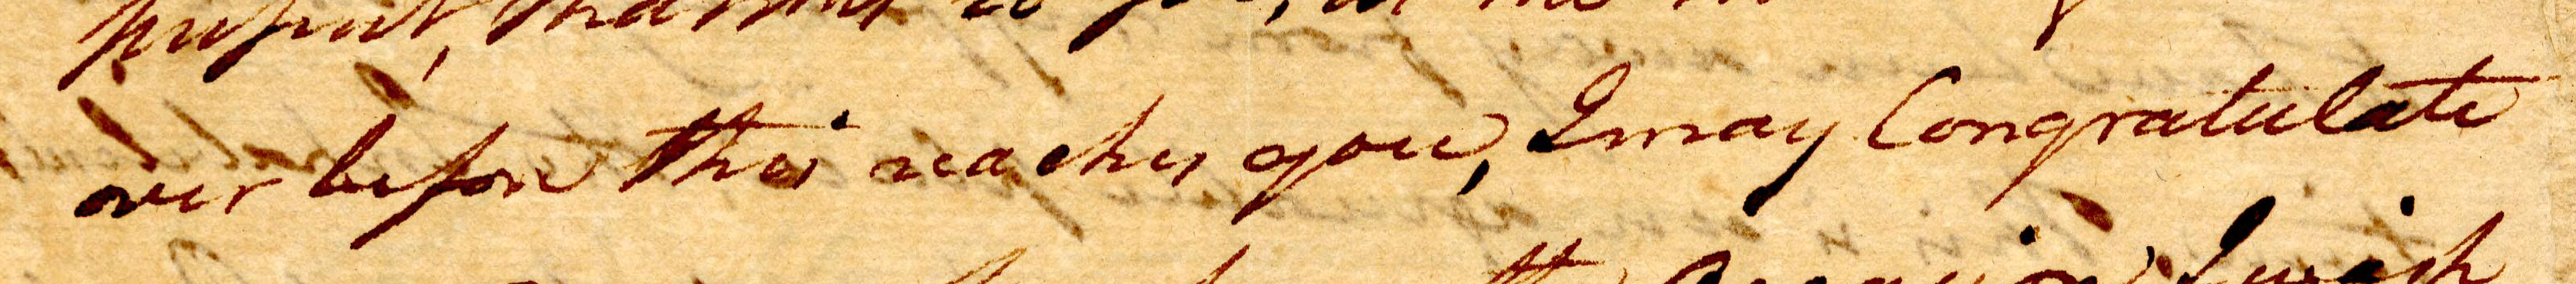over before this reaches you, I may Congratulate
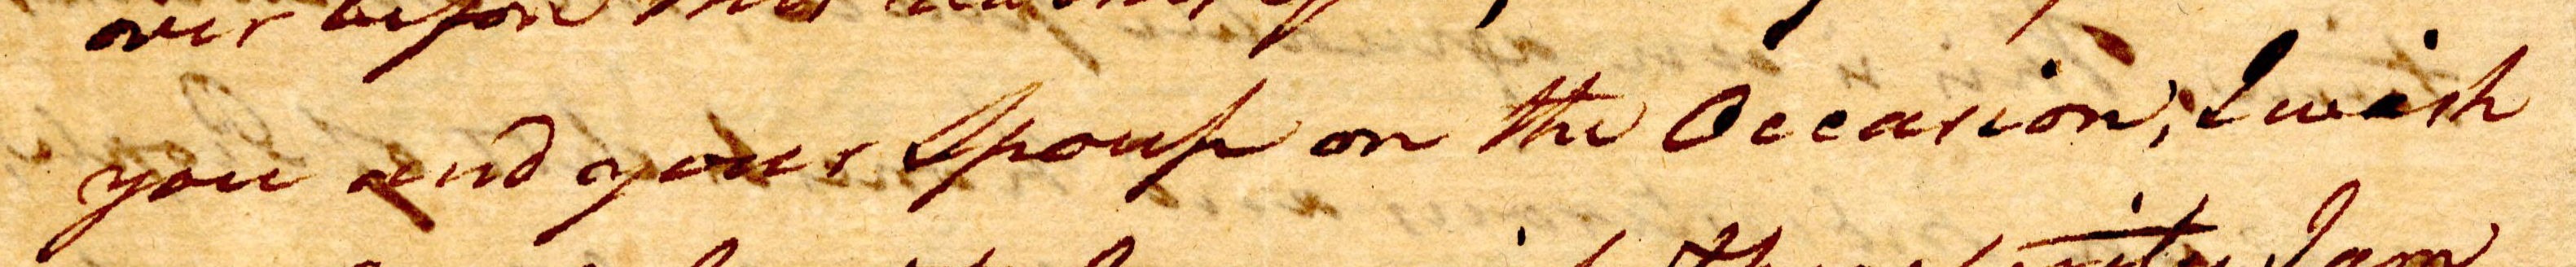you and your spouse on the Occasion, I wish
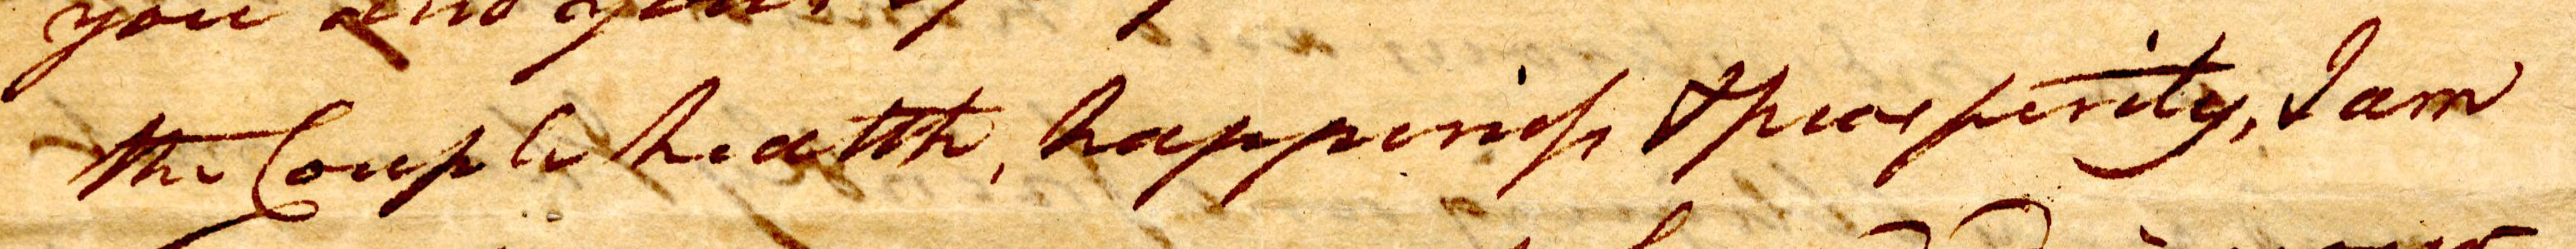the Couple health, happiness & prosperity, I am
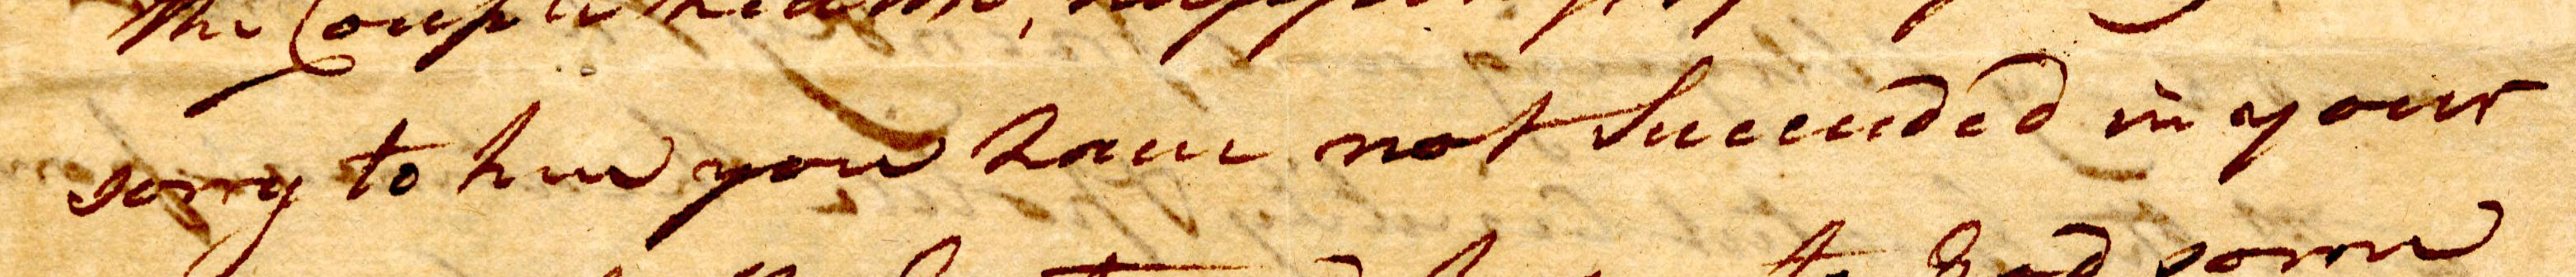sorry to here yo have not succeeded in your
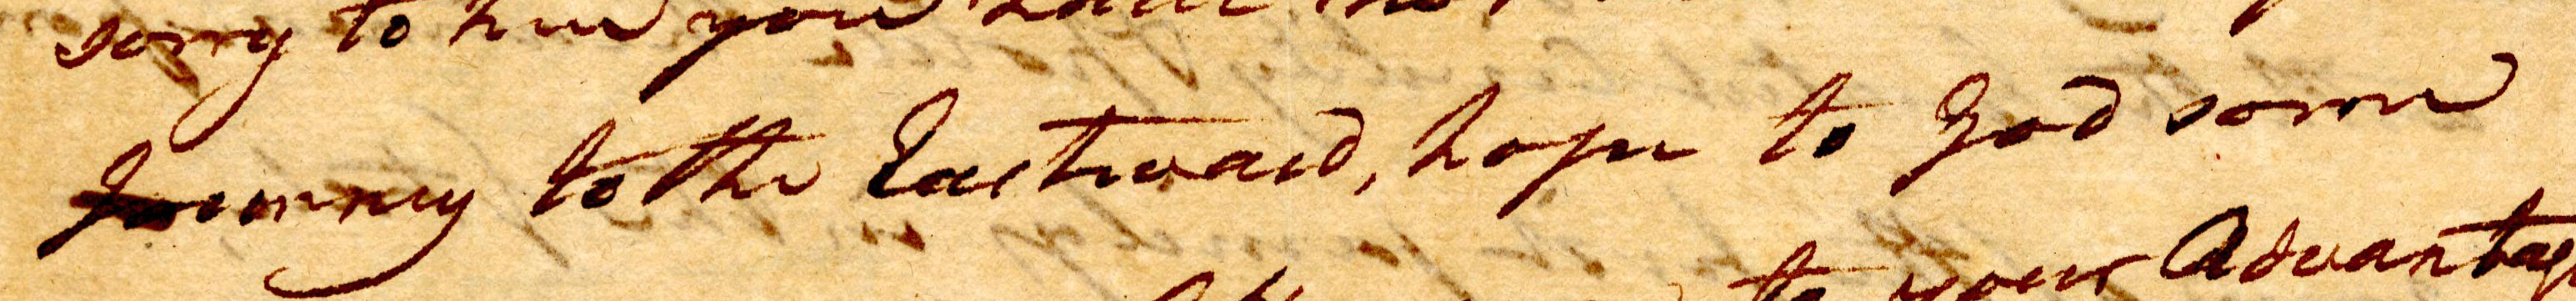Journey to the Eastward, hope to God some
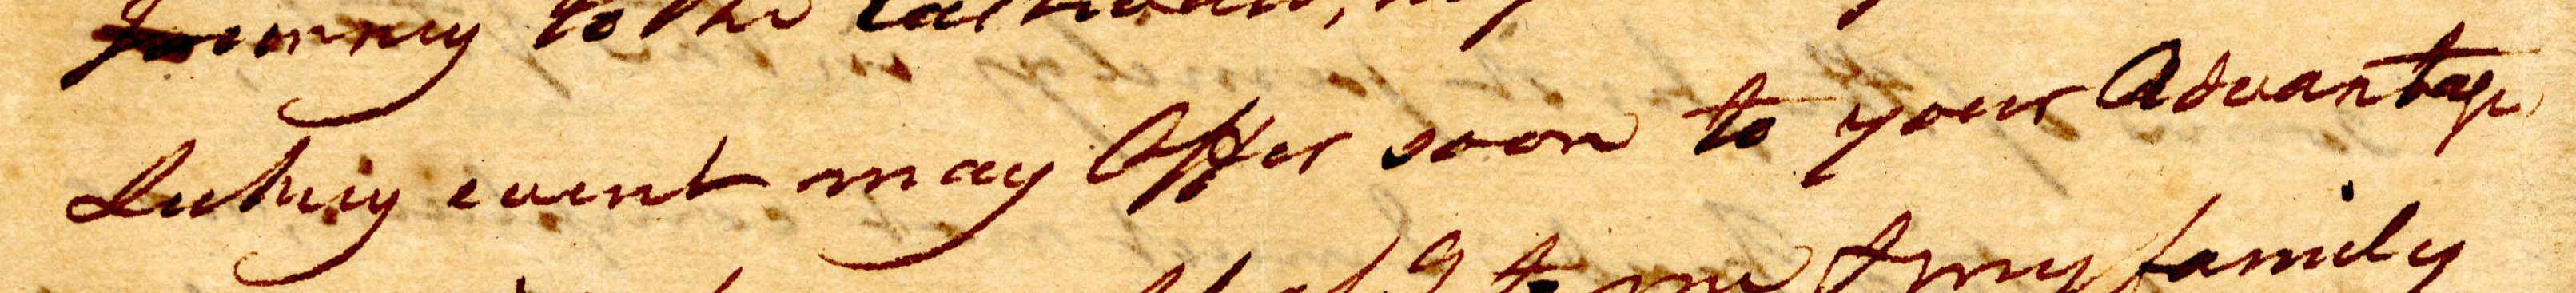Lucky event may Offer soon to your Advantage
